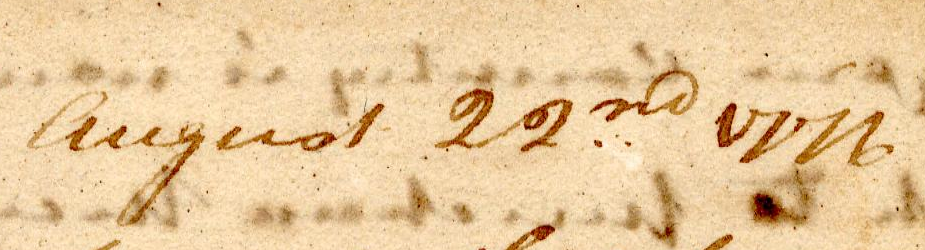August 22n^d 1776
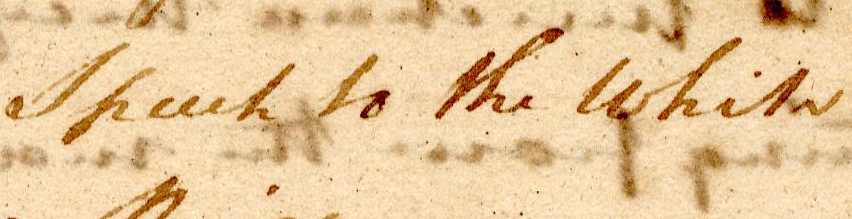Speech to the White
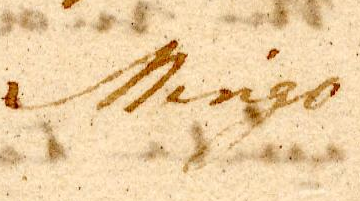Mingo
